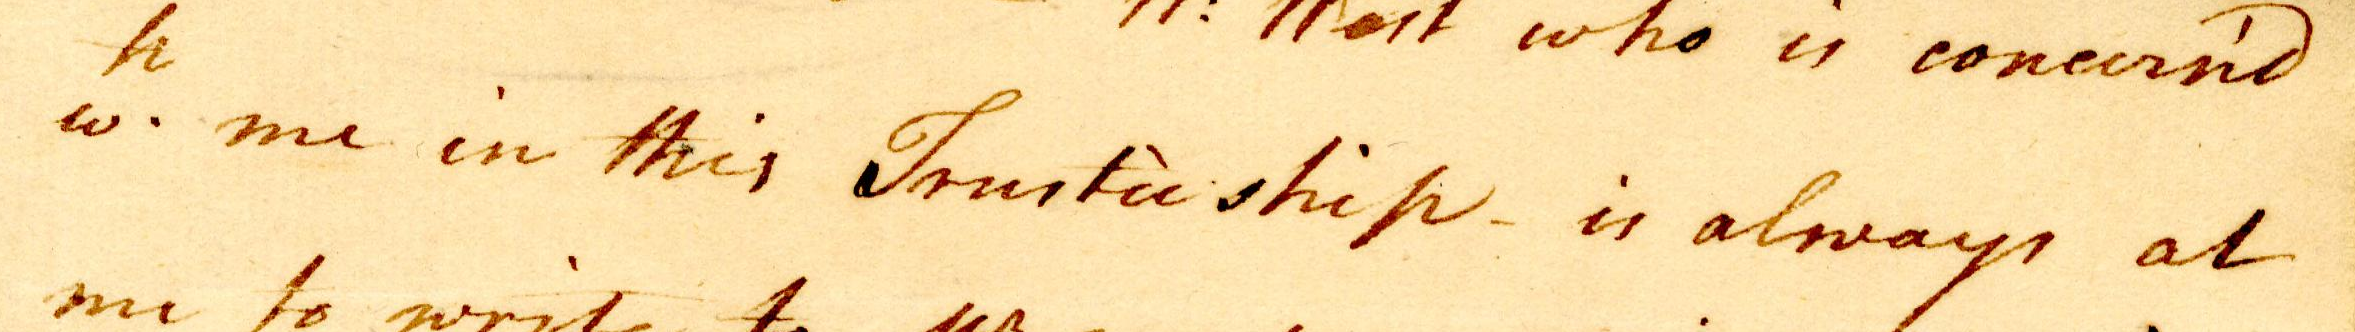w^th. me in this Trusteeship is always at
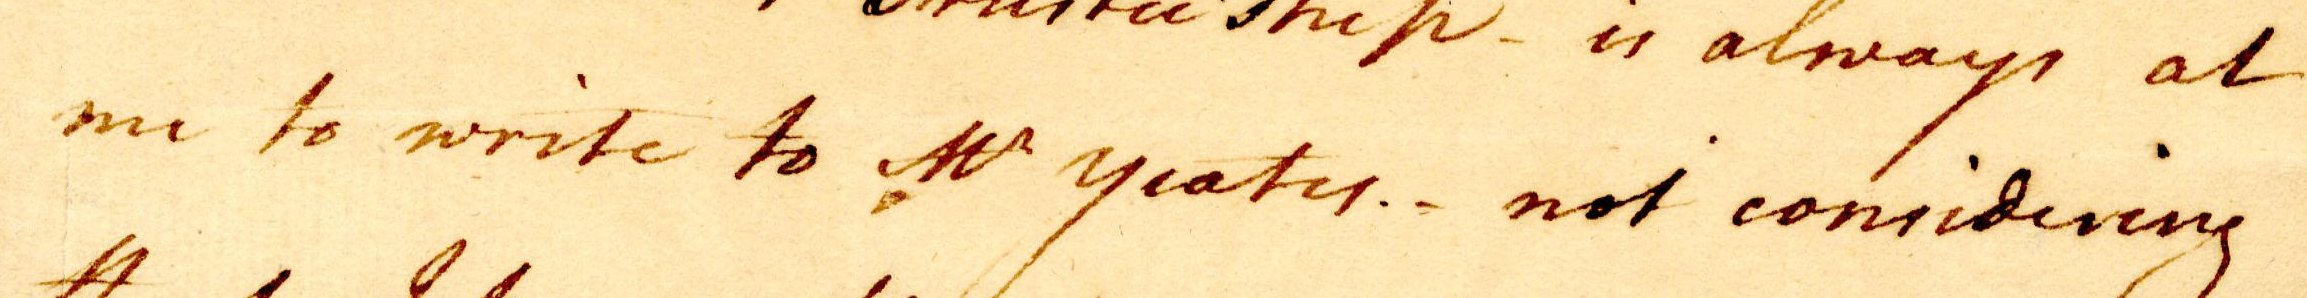me to write to M^r Yeates.- not considering
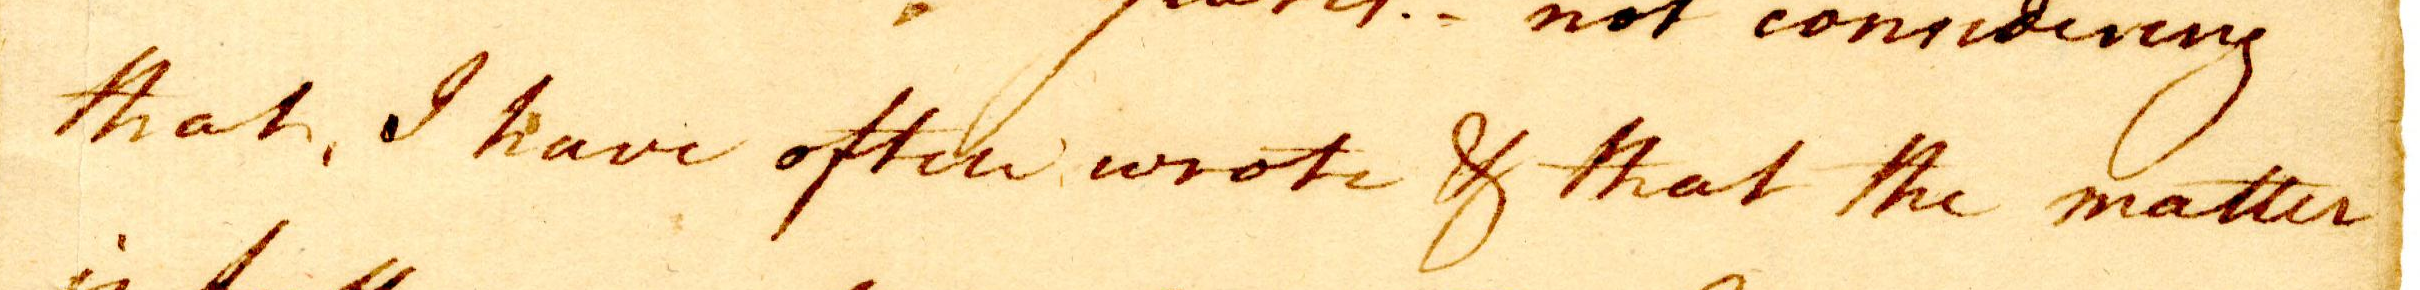that, I have often wrote & that the matter
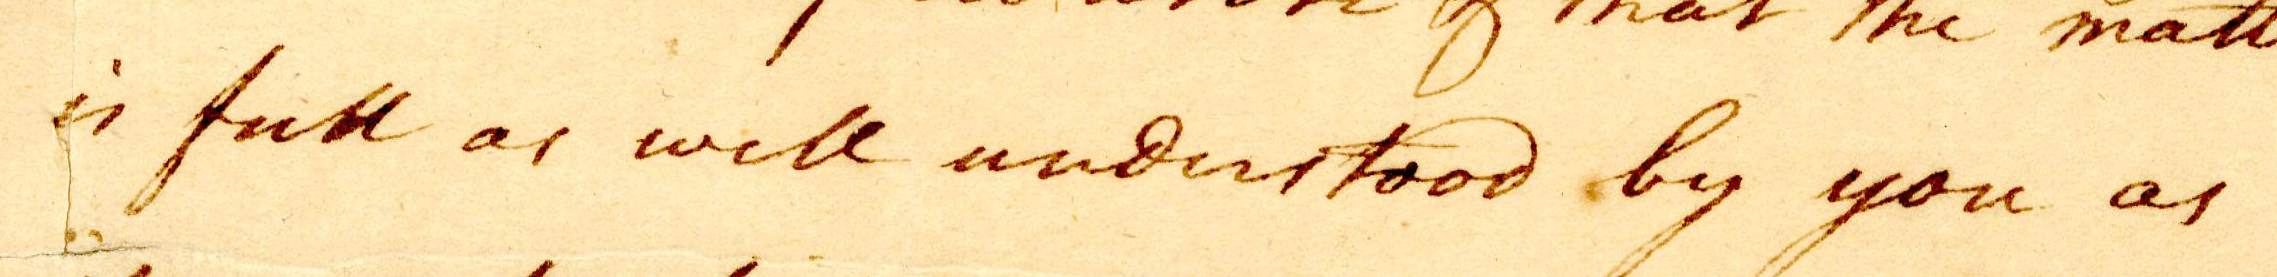is full as well understood by you as
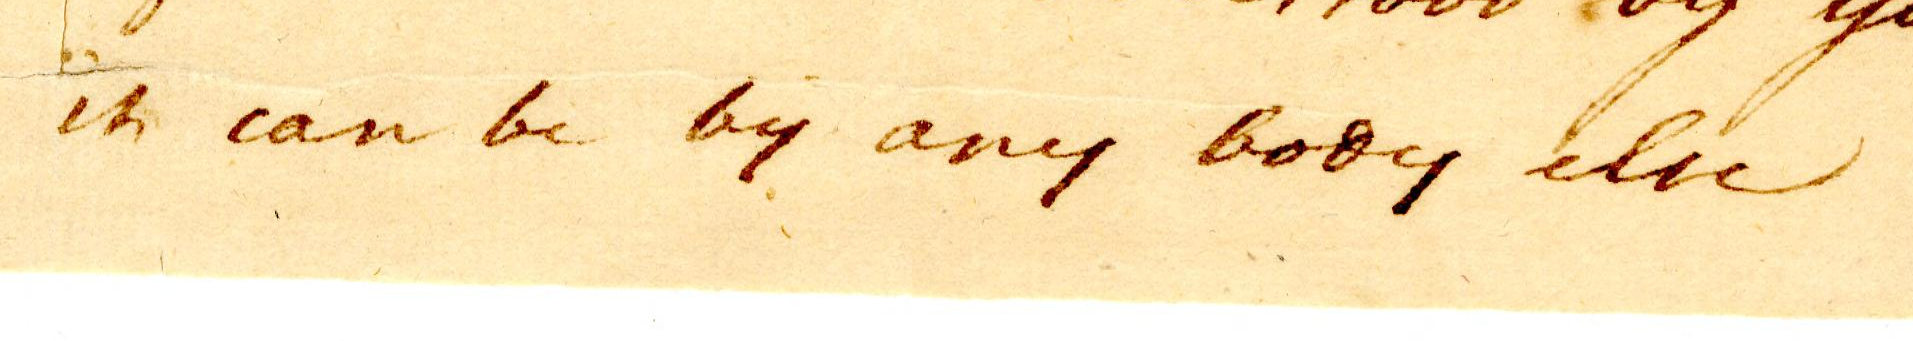it can be by any body else
